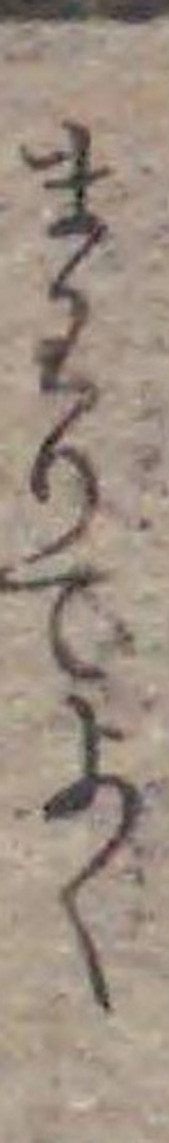まわりてよく
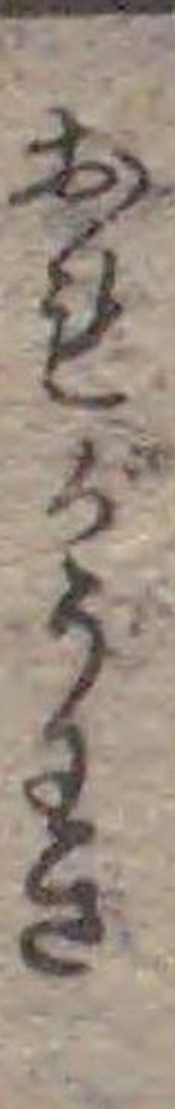おれがうわさ
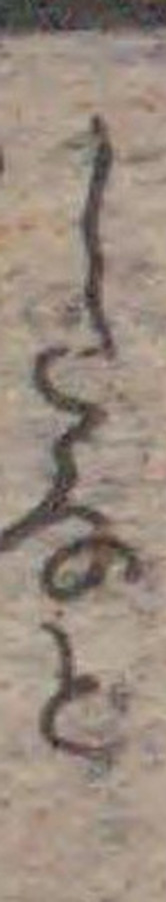したなと
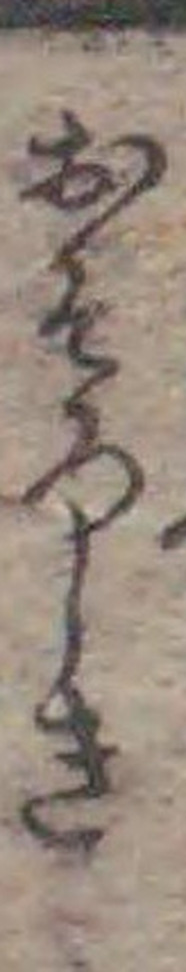おそろしき

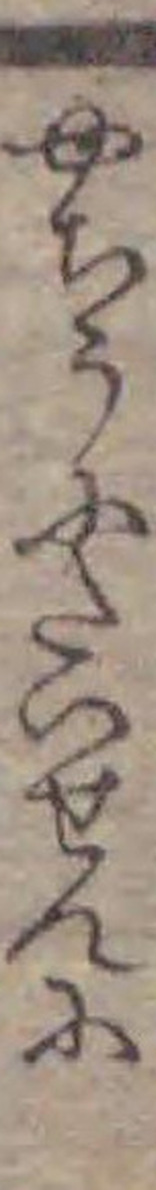やちうにたいせんに
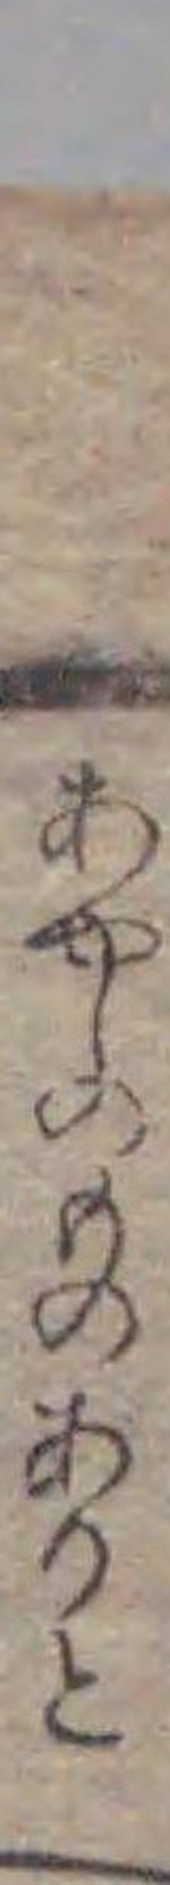あやしのものありと
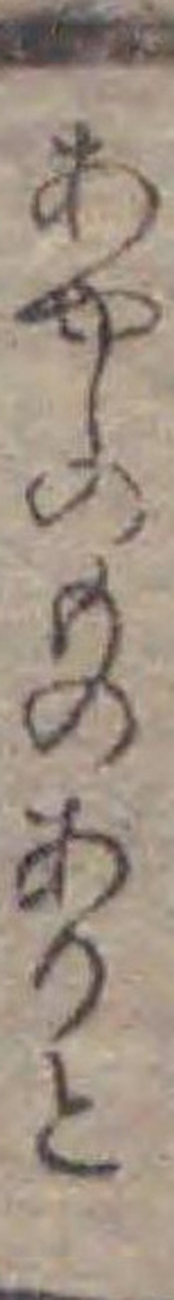あやしのものありと
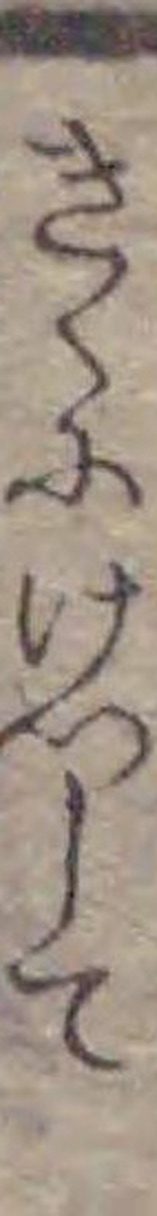きくにけつして
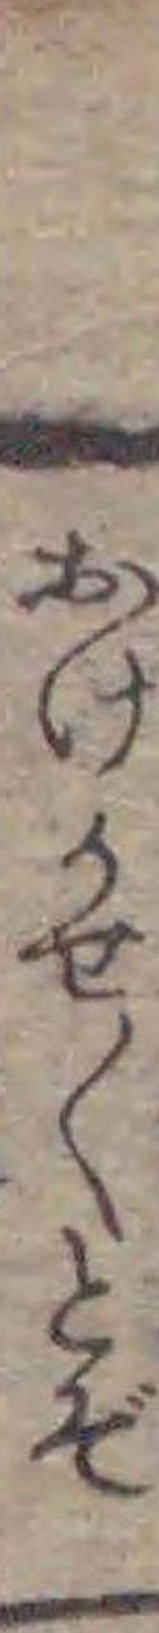おけかせ〳〵とぞ
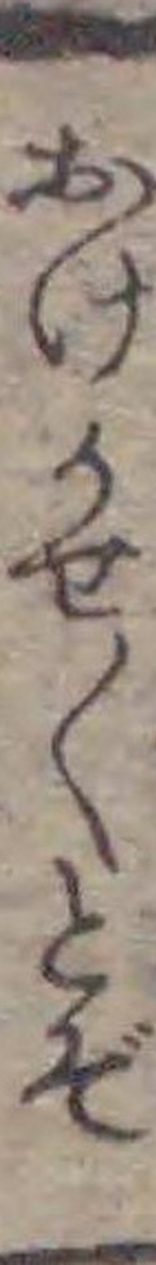おけかせ〳〵とぞ
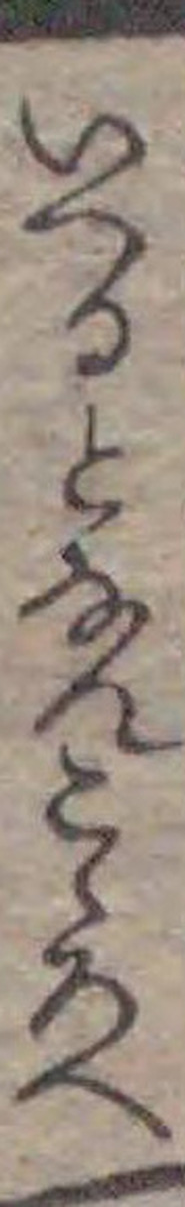いへるとなんこゝろへ
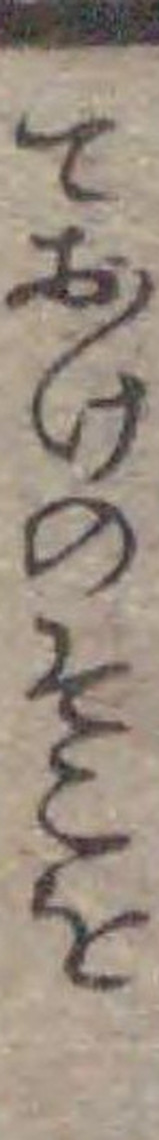ておけのそこを
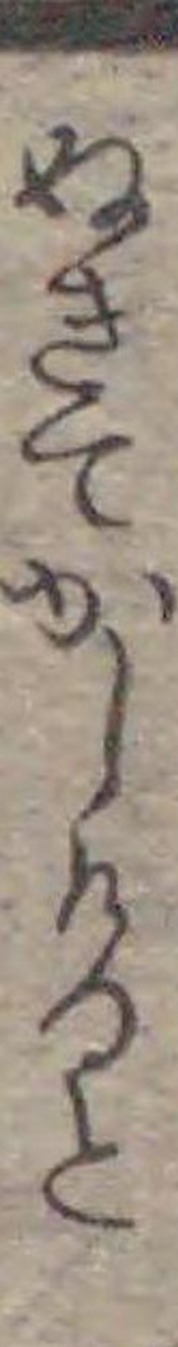ぬきてかしけると
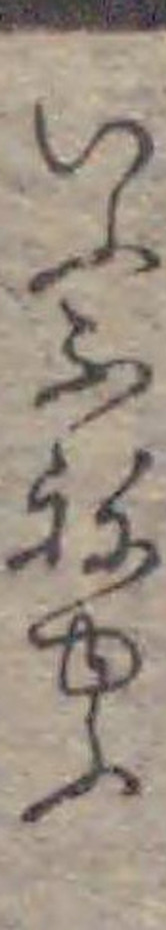いふふねゆふ
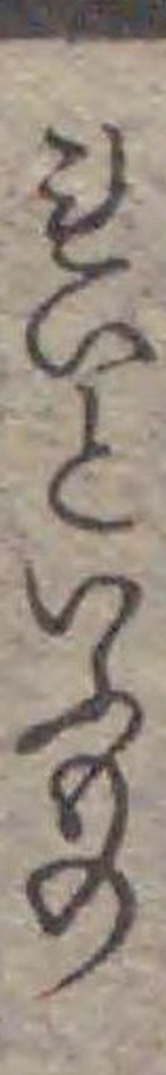れいとおふもの

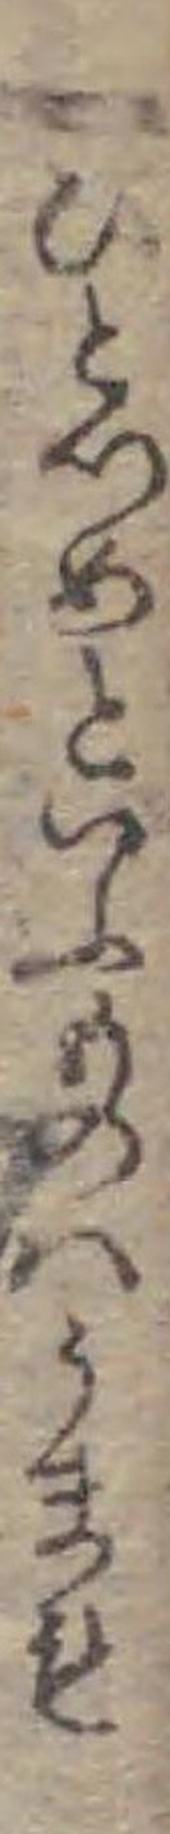ひとつめといふものはうまれ
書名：変化物春遊 : 2巻
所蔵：国立国会図書館 National Diet Library, JAPAN
